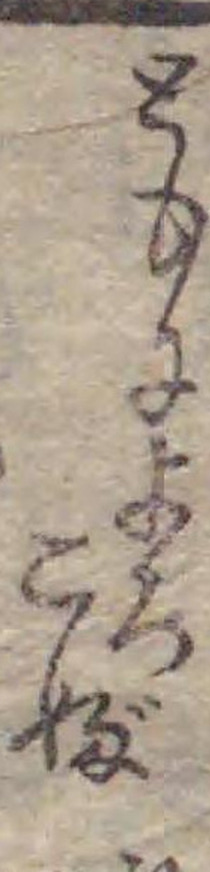ともによろ
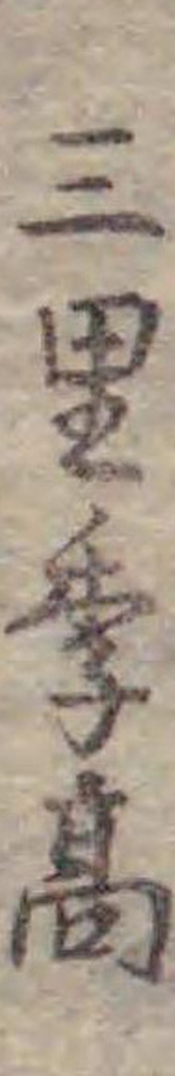三里季髙
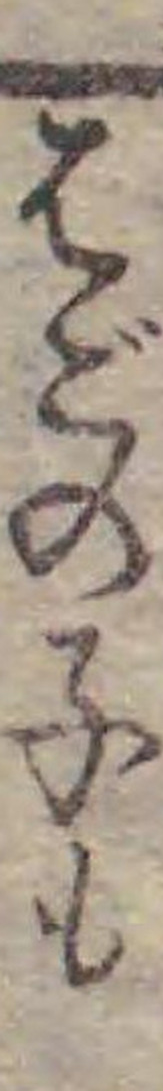はごの子も
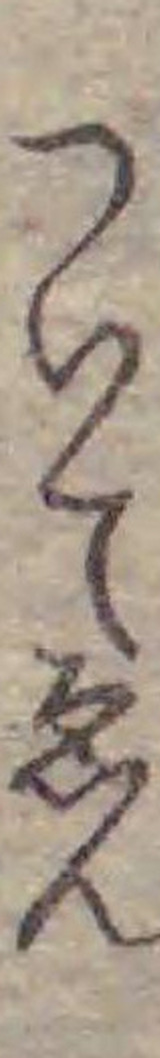ついてゑん
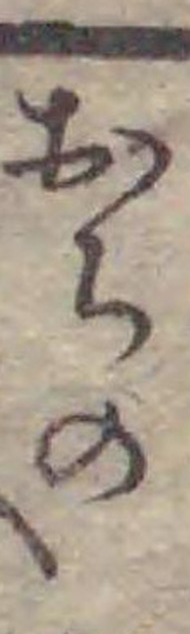おちの
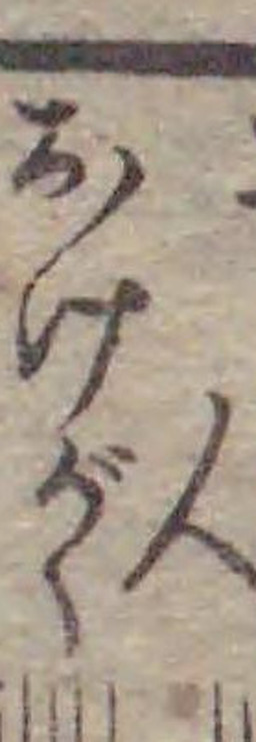おけがゝ
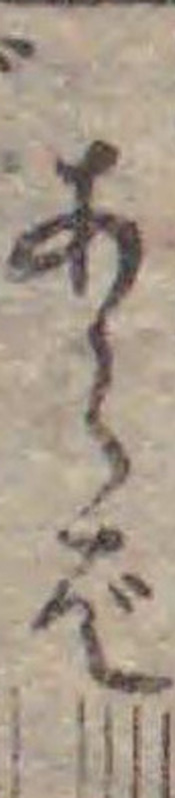あらば
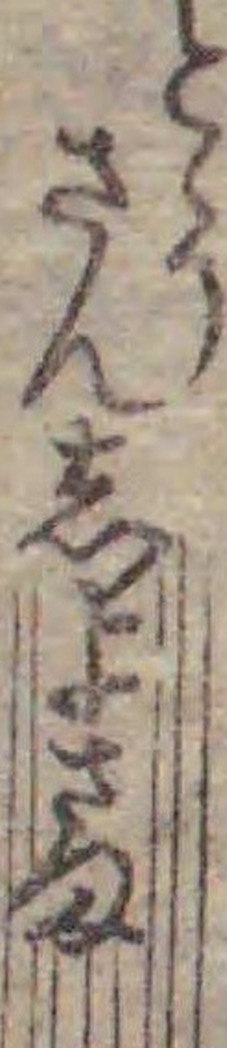さんしよさま

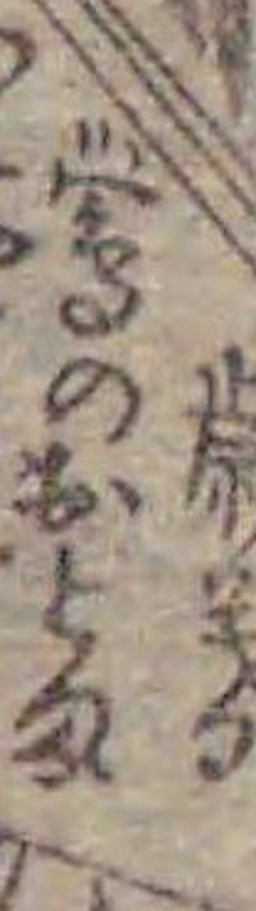鴬のおとま
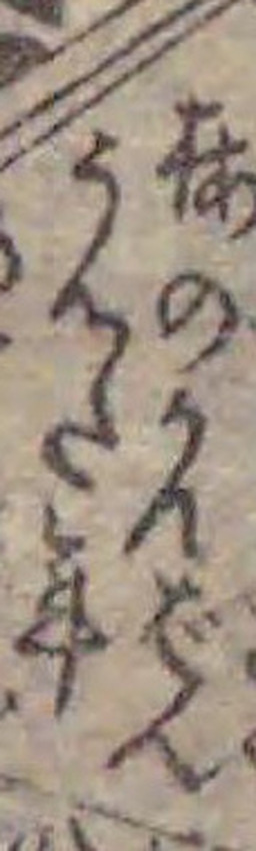うつた年
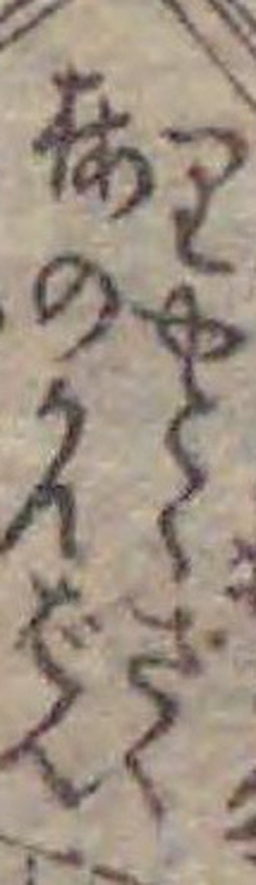梅のかんばん
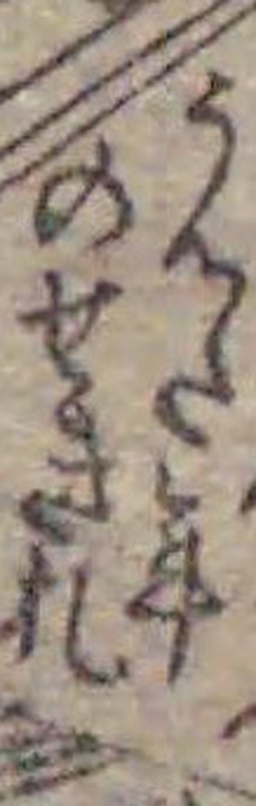のせき札
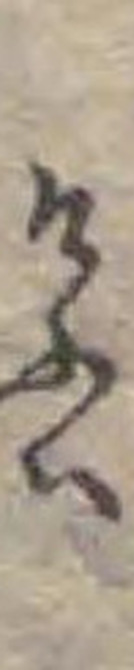けふは
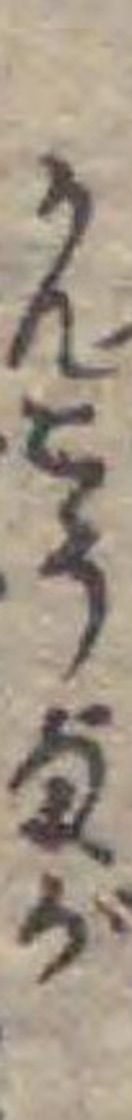かんこう殿が
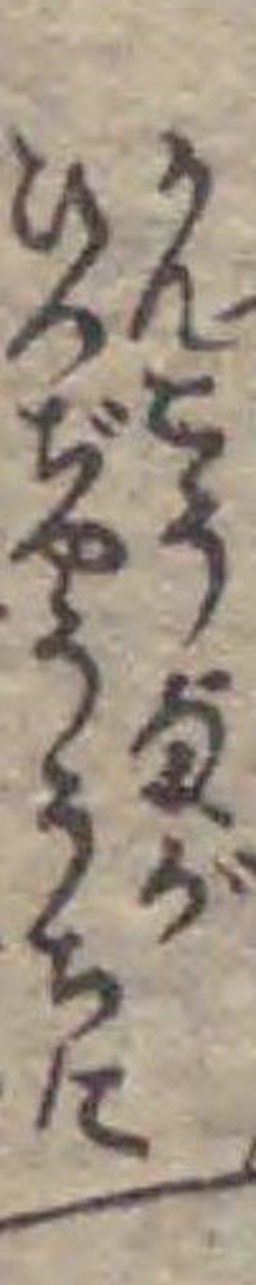ひつぢやううちに
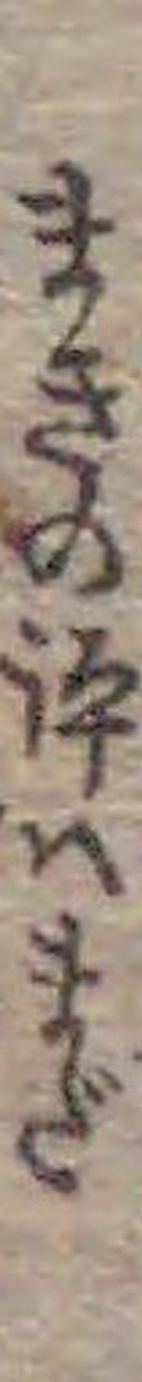まきの評はまだ
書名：年始御礼帳 : 3巻
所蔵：国立国会図書館 National Diet Library, JAPAN
